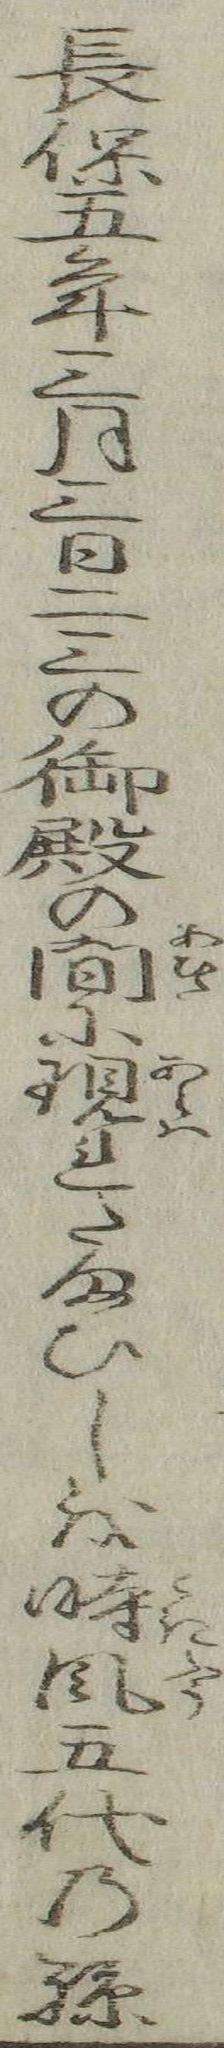長保五年三月三日二三の御殿の間に現れたまひしを時風五代の孫
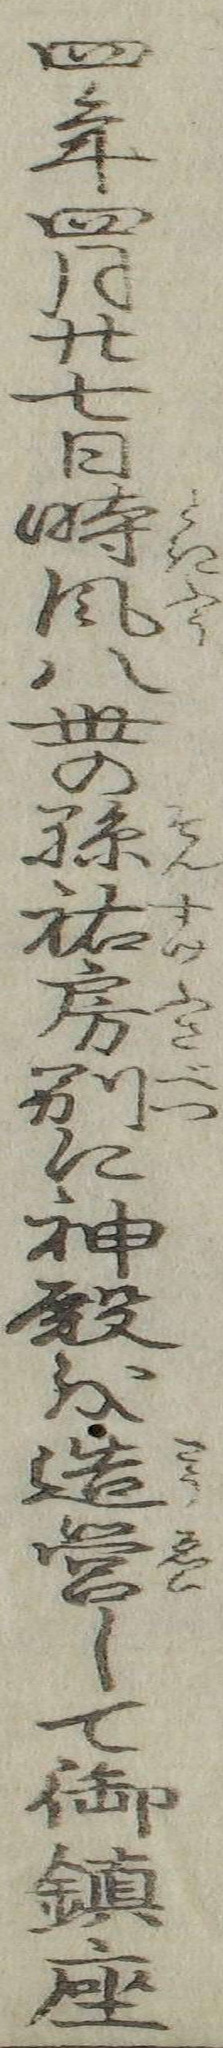四年四月廿七日時風八世の孫祐房別に神殿を造営して御鎭𫝶
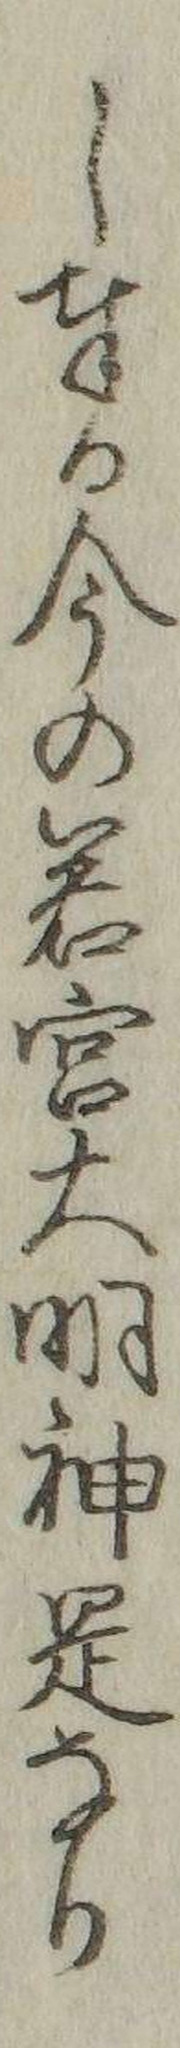し奉る今の若宮大明神是なり

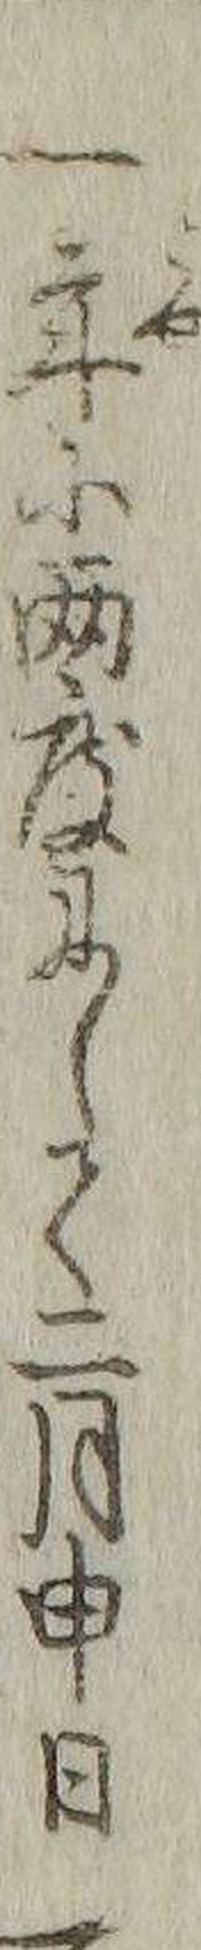一年に两度にして二月申日
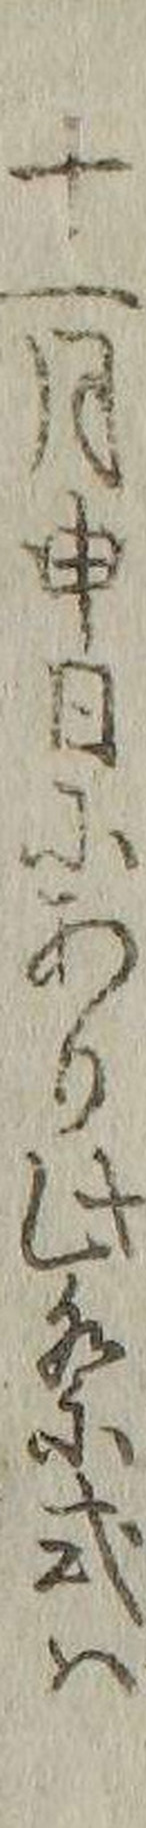十一月申日にあり此祭式は
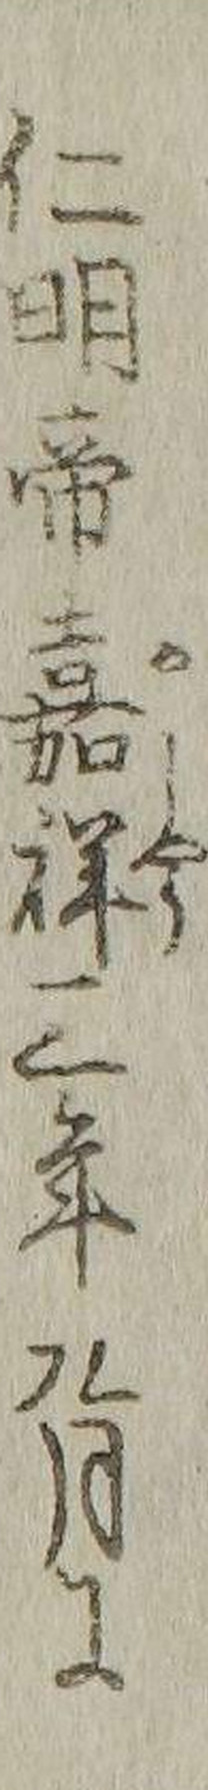仁明帝嘉祥三年九月に
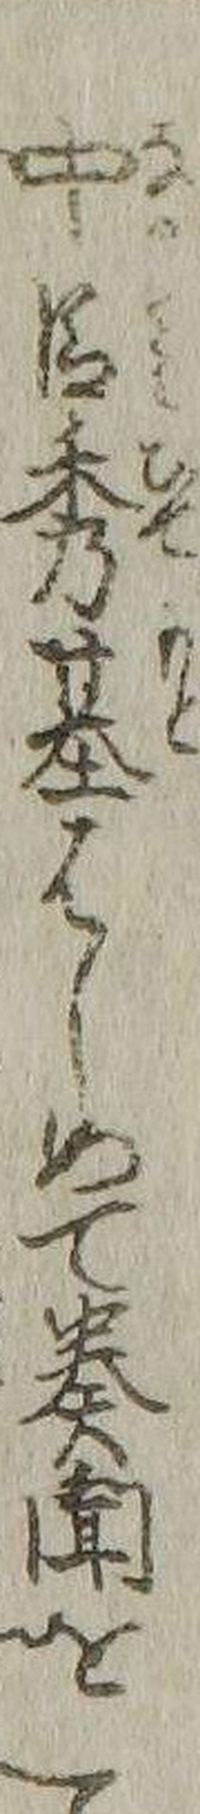中臣秀基はしめて奏聞を
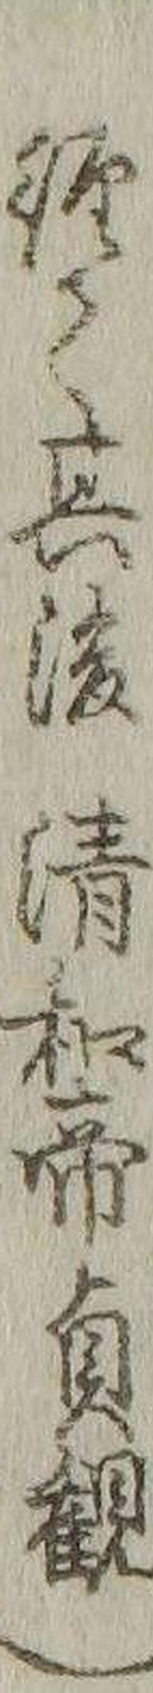經て其後清和帝貞観
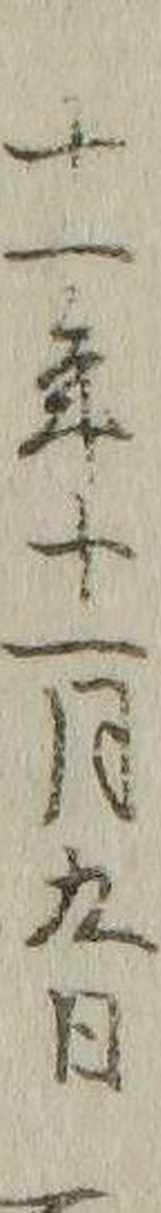十一年十一月九日
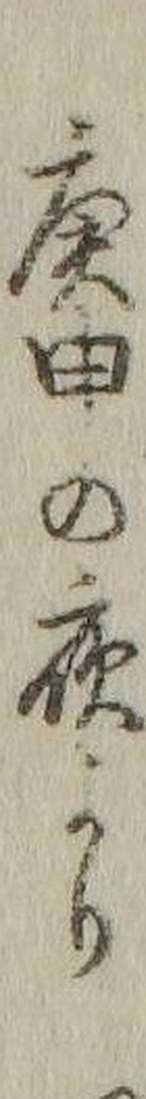庚申の夜より
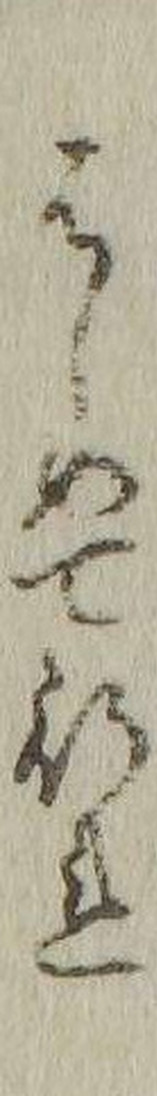はしめて行れ
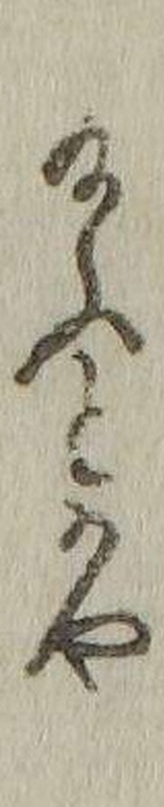給ふとかや
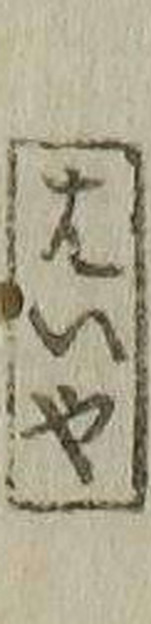はいや
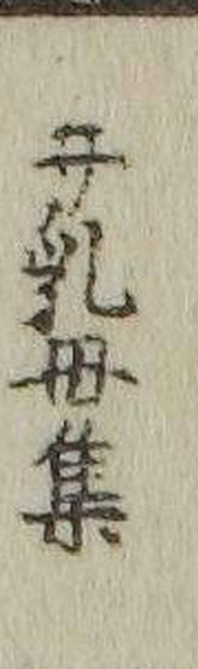弁乳母集
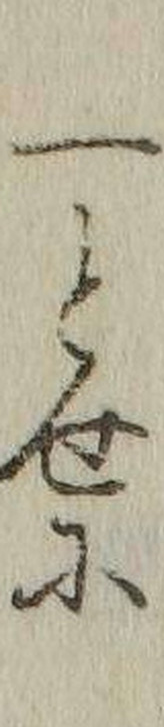一とせに
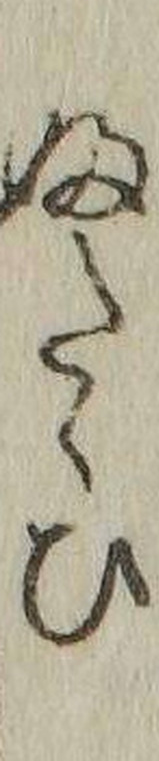ふたゝひ
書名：大和名所圖會
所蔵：国文学研究資料館
